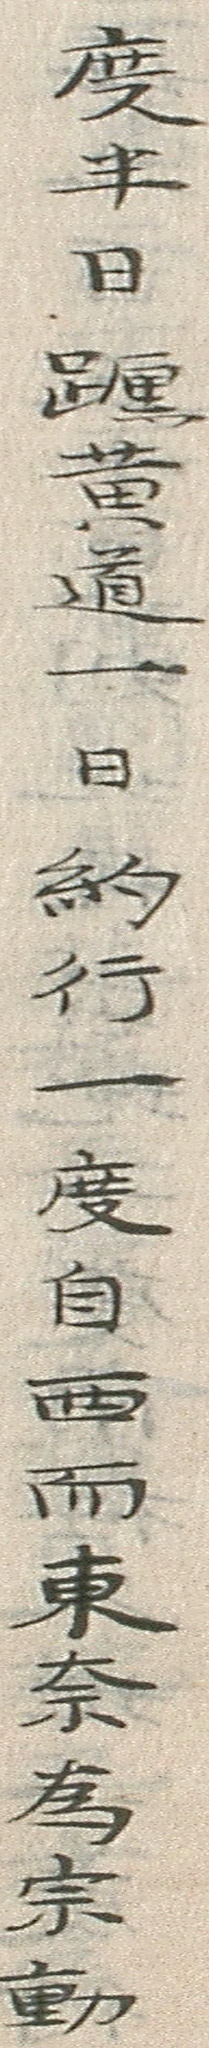度半日躔黄道一日約行一度自西而東奈為宗動
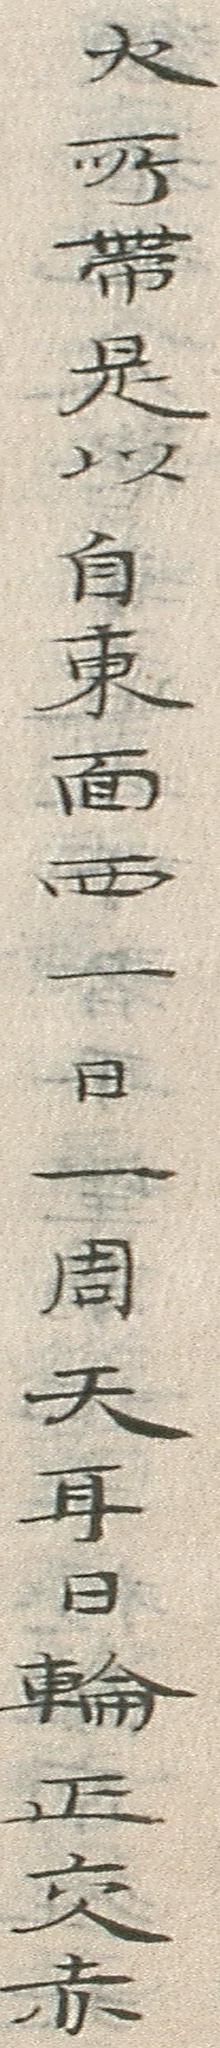火所帯是以自東而西一日一周天耳日輪正交赤
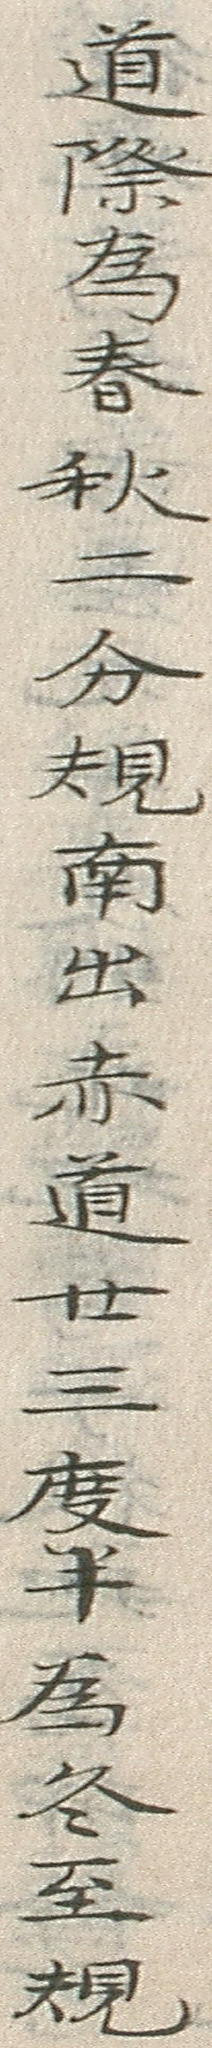道際為春秋二分規南出赤道廿三度半為冬至規
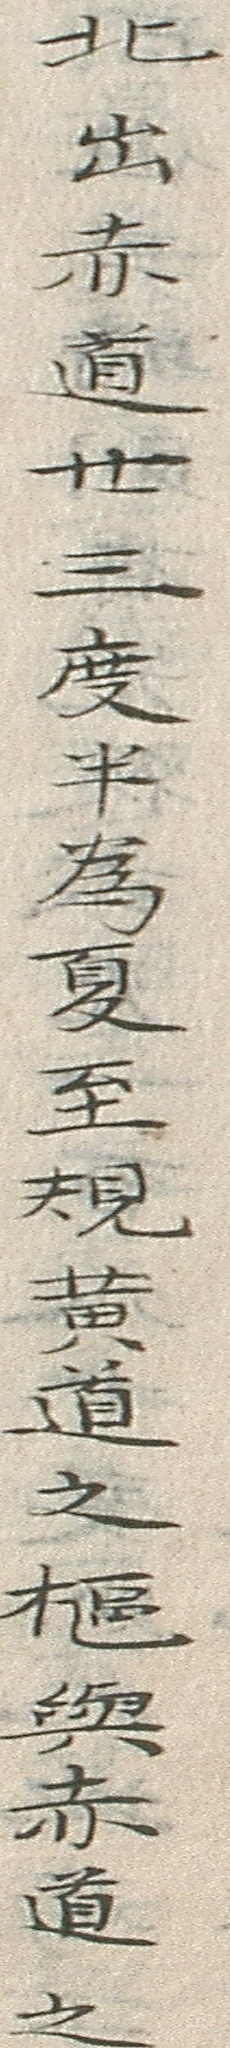北出赤道廿三度半為夏至規黄道之枢与赤道之
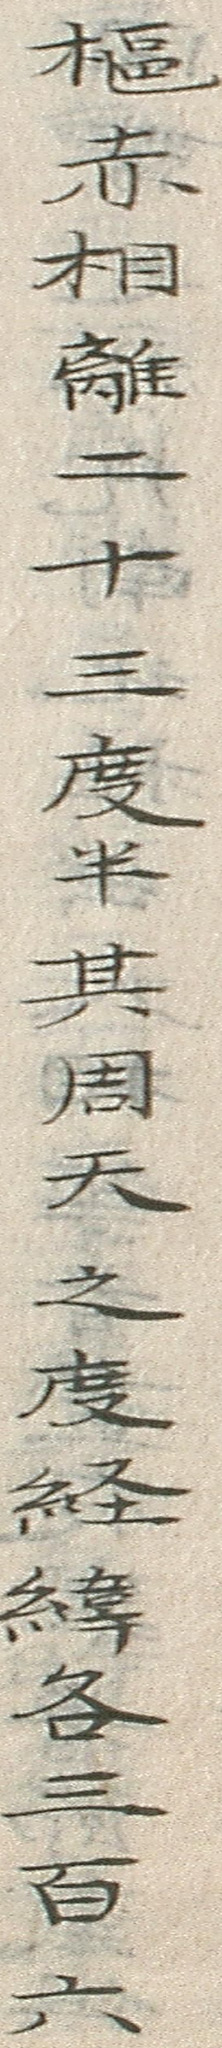枢亦相離二十三度半其周天之度経緯各三百六
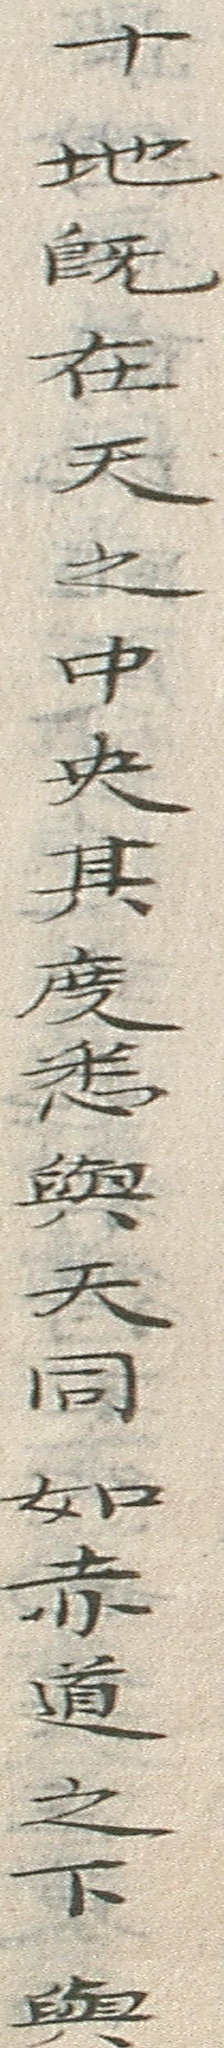十地既在天之中央其度悉与天同如赤道之下与
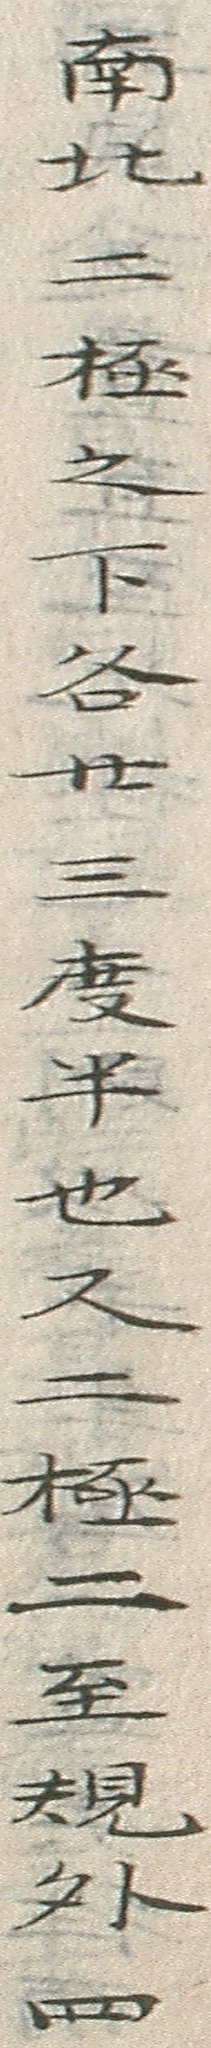南北二極之下各廿三度半也又二極二至規外四
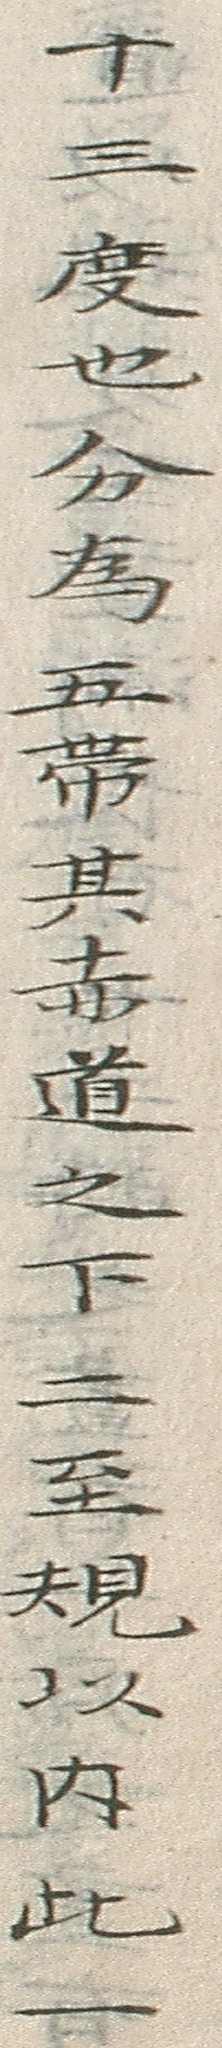十三度也分為五帯其赤道之下二至規以内此一
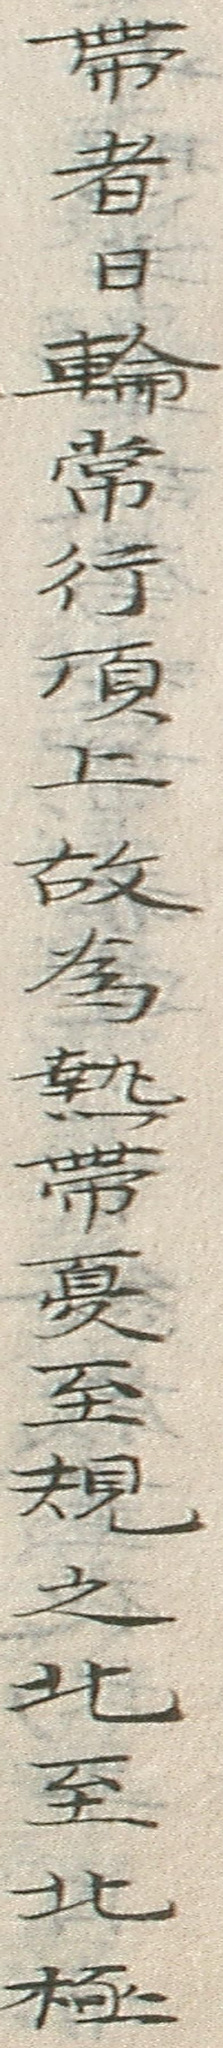帯者日輪常行頂上故為熱帯夏至規之北至北極
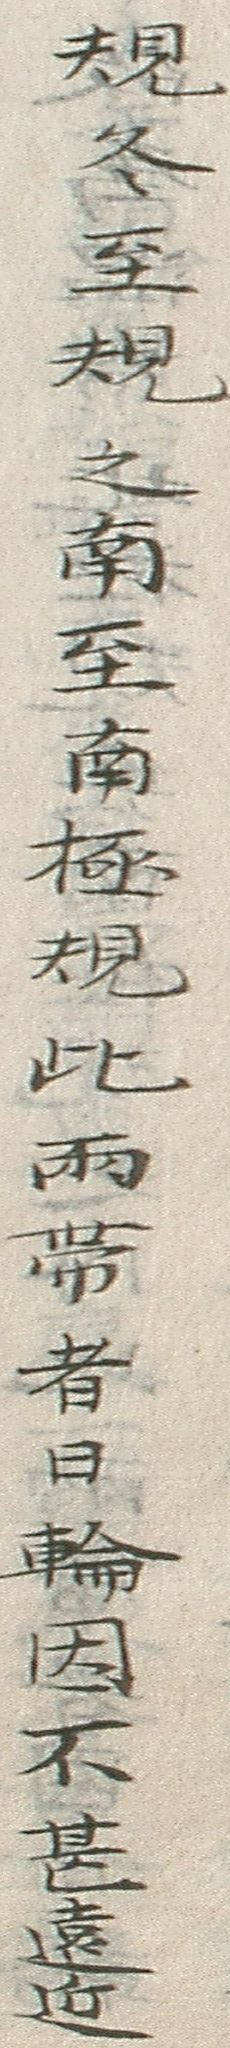規冬至規之南至南極規此両帯者日輪因不甚遠近

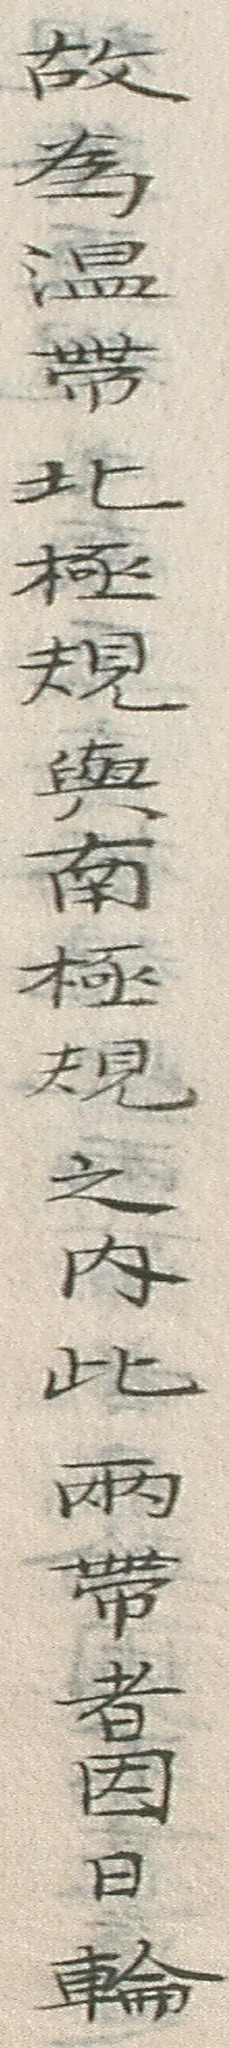故為温帯此北極規与南極規之内此両帯者因日輪
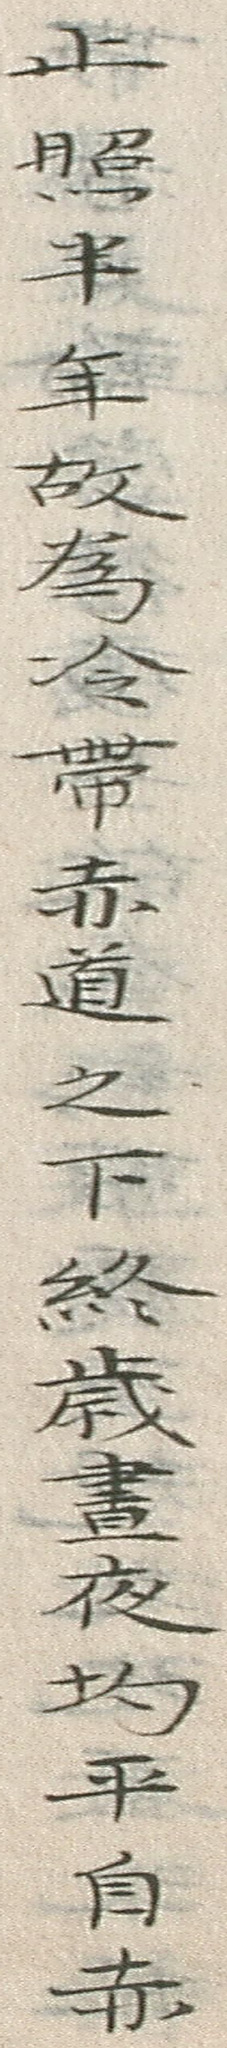止照半年故為冷帯赤道之下終歳昼夜均平自赤
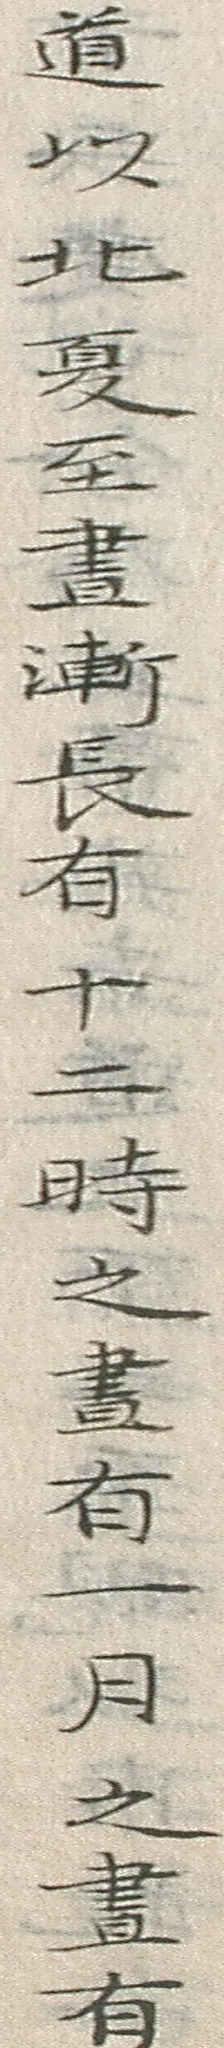道以北夏至昼漸長有十二時之昼有一日之昼有
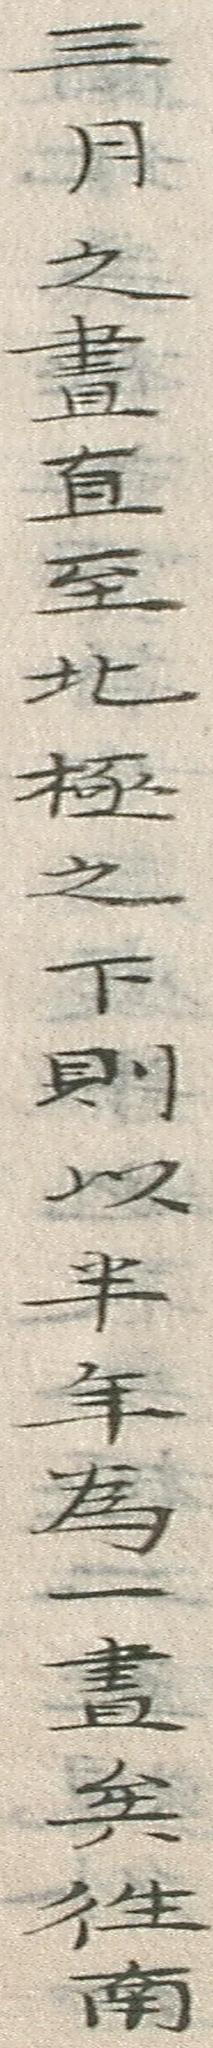三月之昼直至北極之下則以半年為一昼矣往南
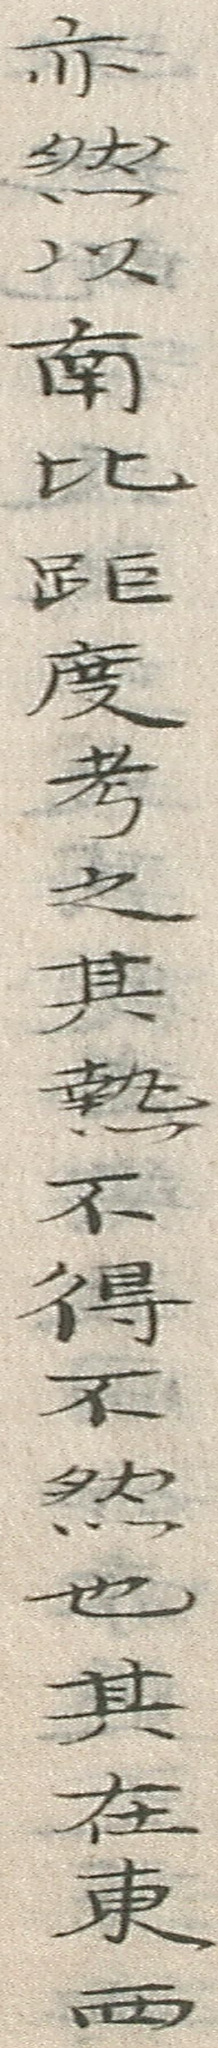亦然以南北距度考之其熱不得不然也其在東西
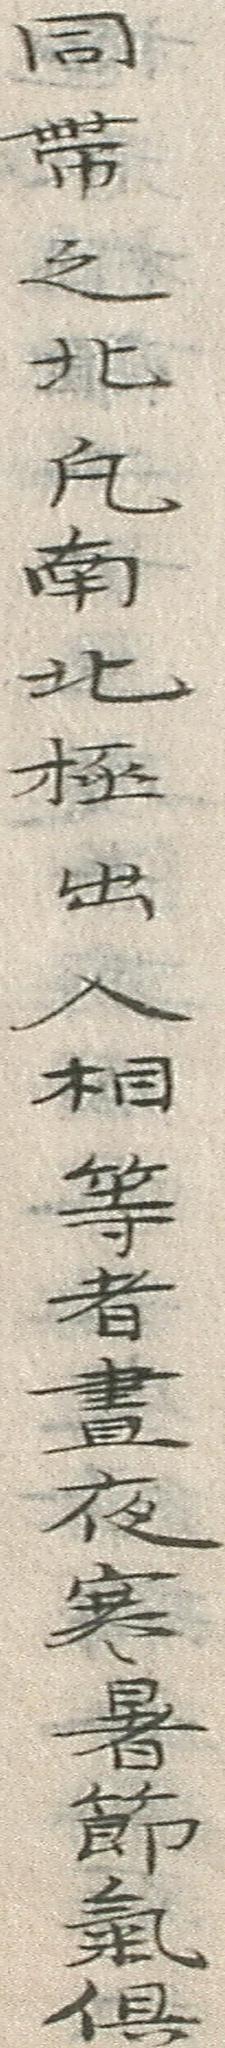同帯之北凡南北極出入相等者昼夜寒暑節気俱
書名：天學略名目羽翼　全
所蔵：東京大学地震研究所図書室 Earthquake Research Institute Library, The University of Tokyo, JAPAN
